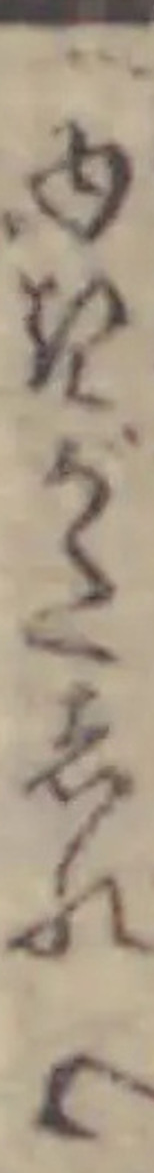ゆきかたしれ
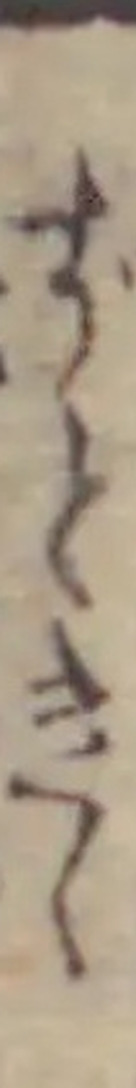ずときゝ
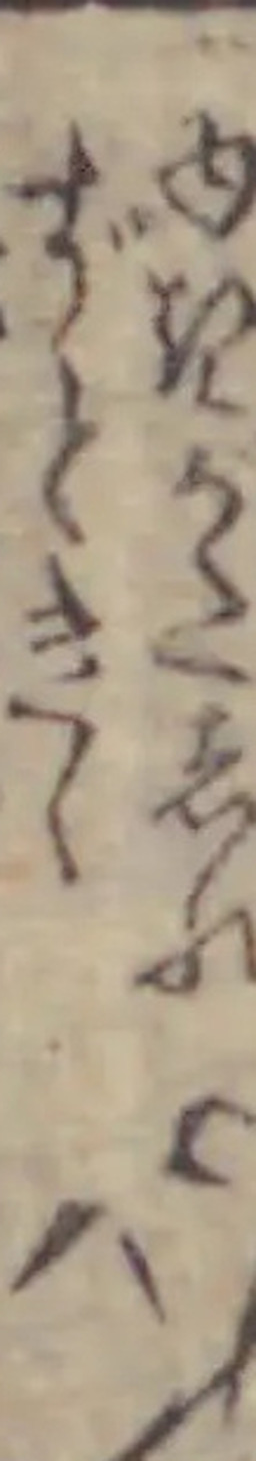ずときゝ
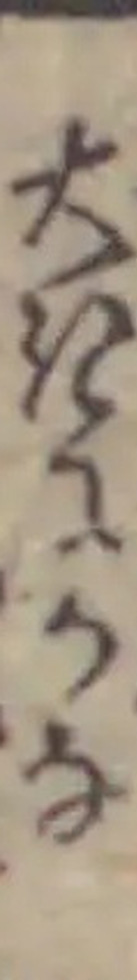大きにかな
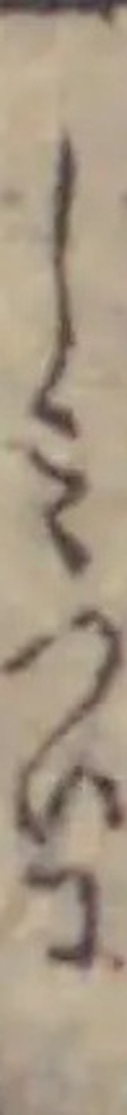しみついに
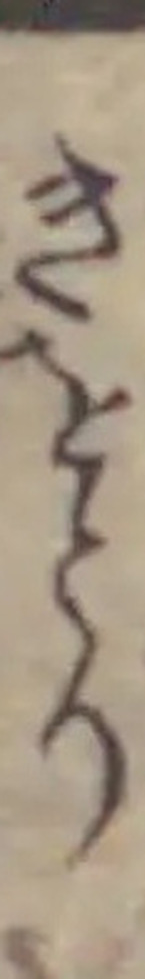きをとり
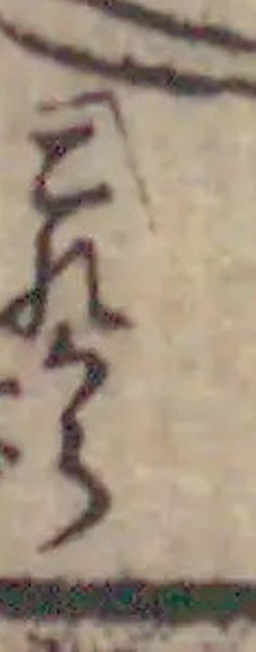〽これから
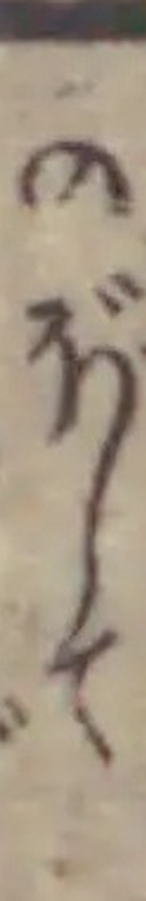のぼして
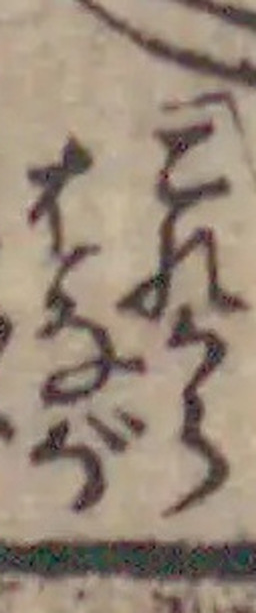はなが
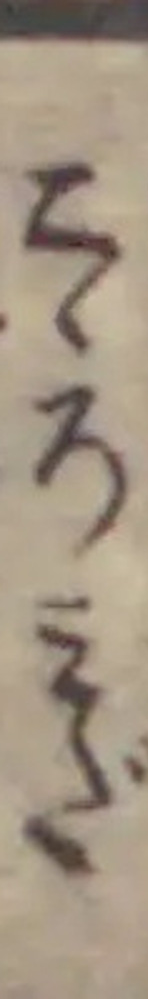こゝろみだ
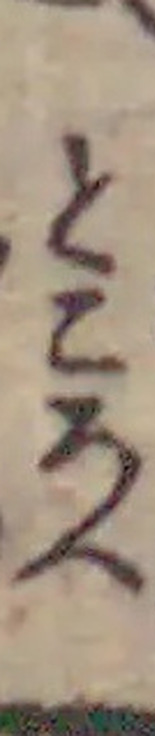ところへ
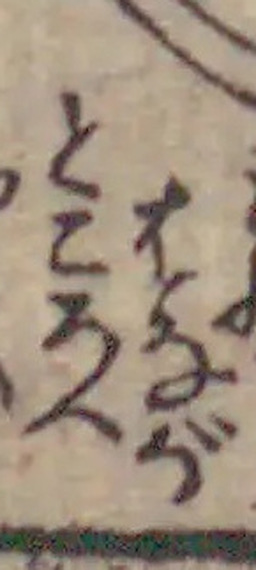ところへ
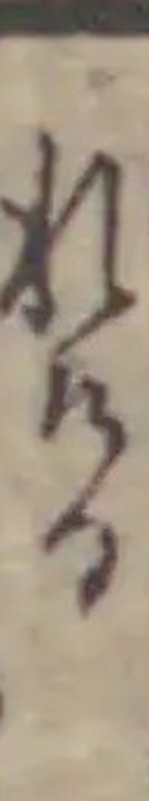れける
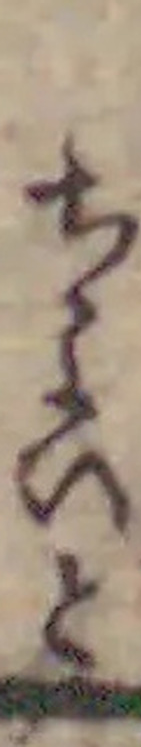ちよいと
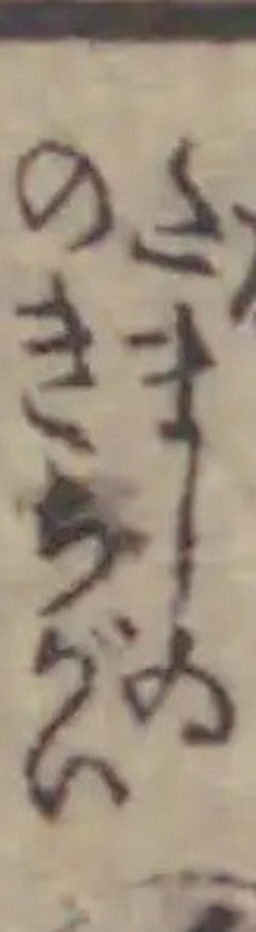のきちがい
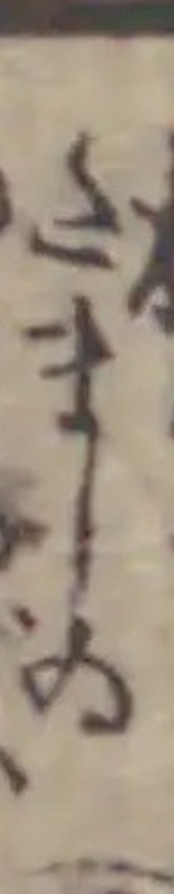たましゐ
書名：腹内養生主論 3巻
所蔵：国立国会図書館 National Diet Library, JAPAN
